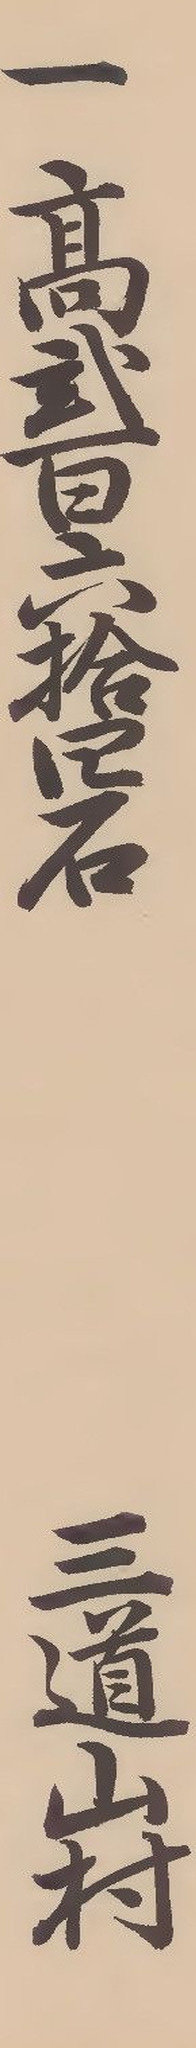一高弐百六拾四石三道山村
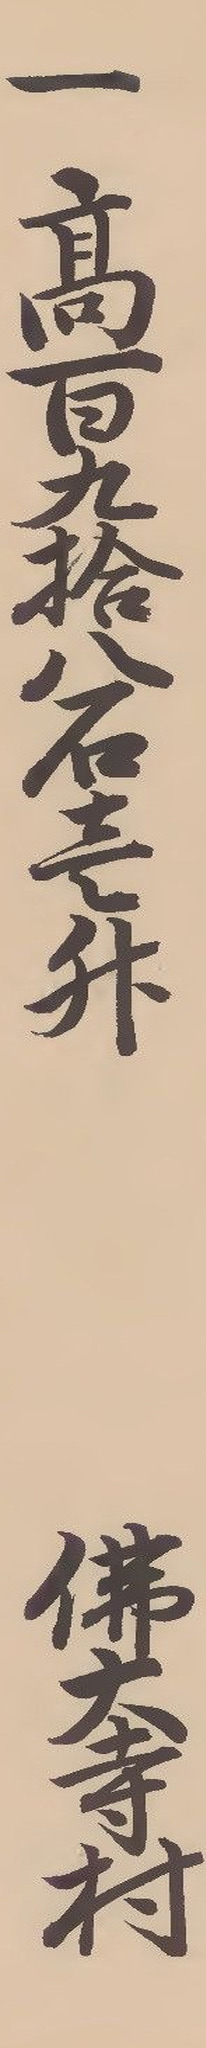一高百九拾八石壱升仏大寺村

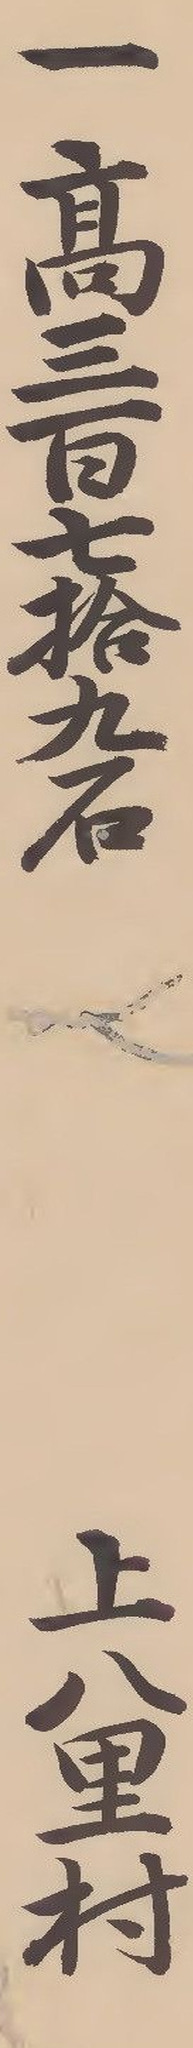一高三百七拾九石上八里村
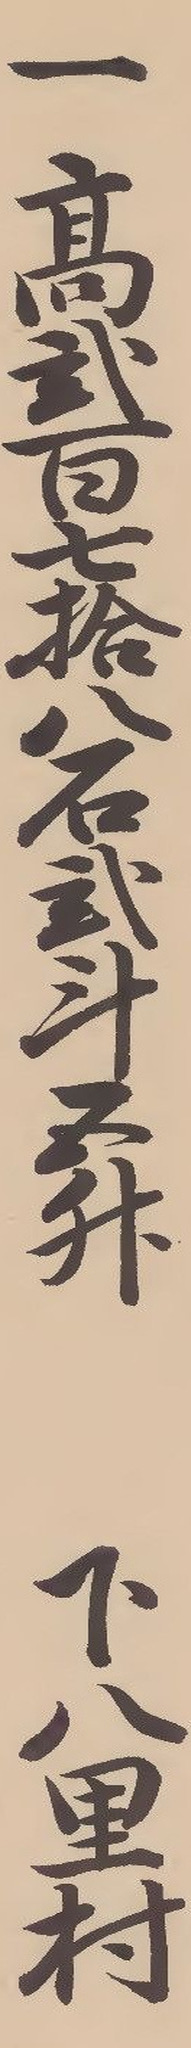一高弐百七拾八石弐斗五升下八里村
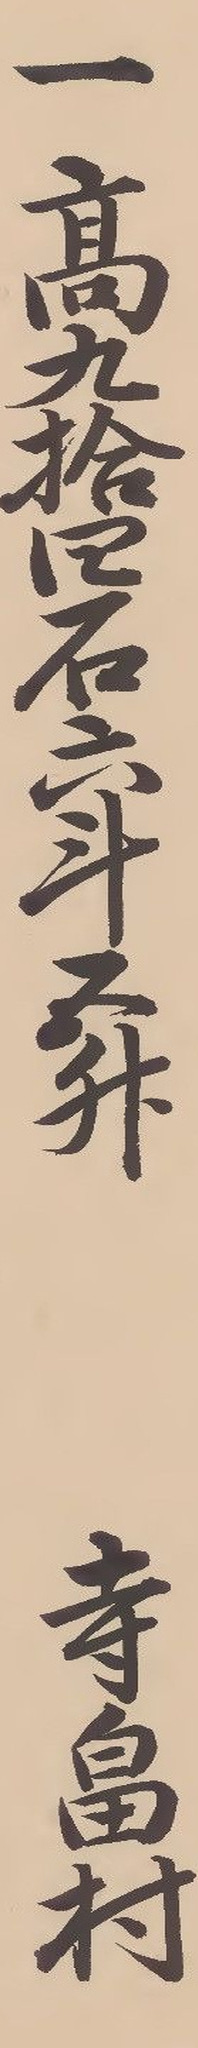一高九拾四石六斗五升寺畠村
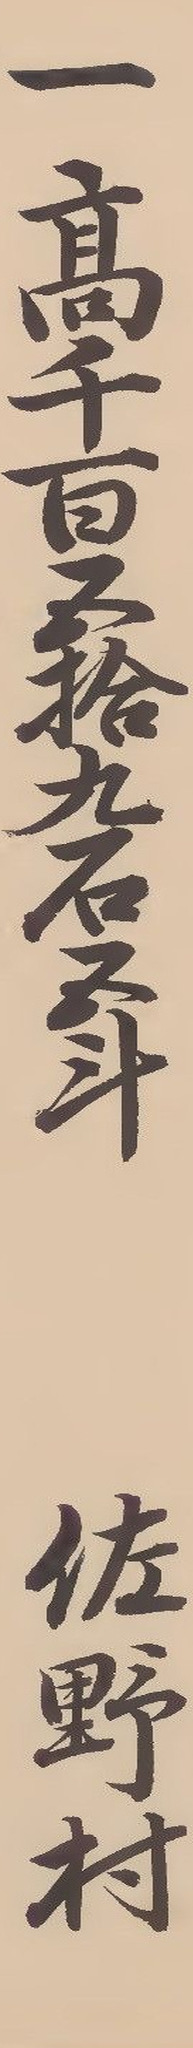一高千百五拾九石五斗佐野村
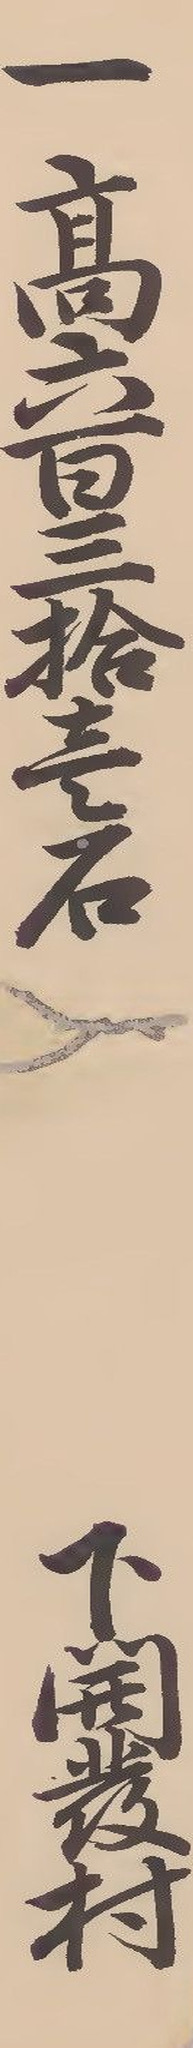一高六百三拾壱石下開発村

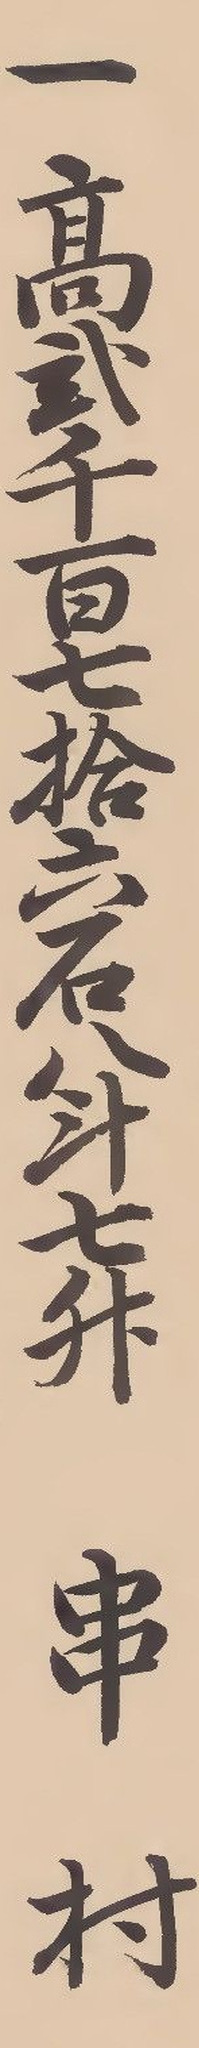一高弐千百七拾六石八斗七升串村
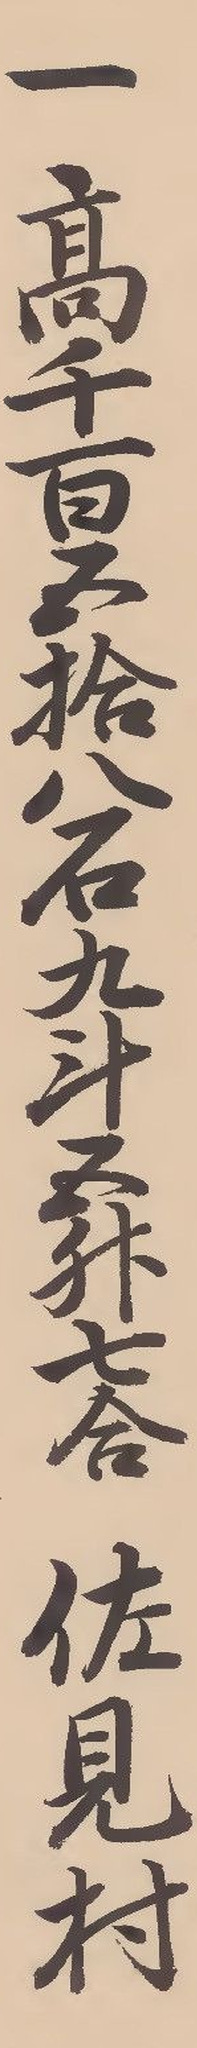一高千百五拾八石九斗五升七合佐見村
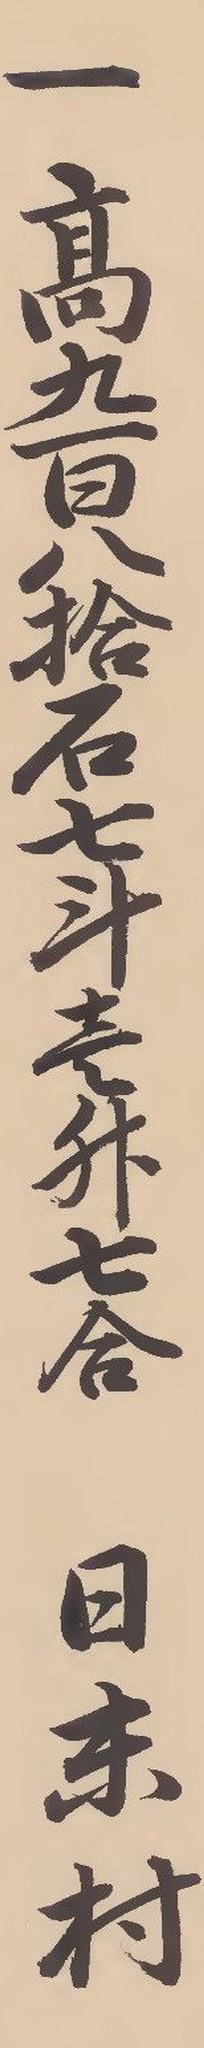一高九百八拾石七斗壱升七合日末村
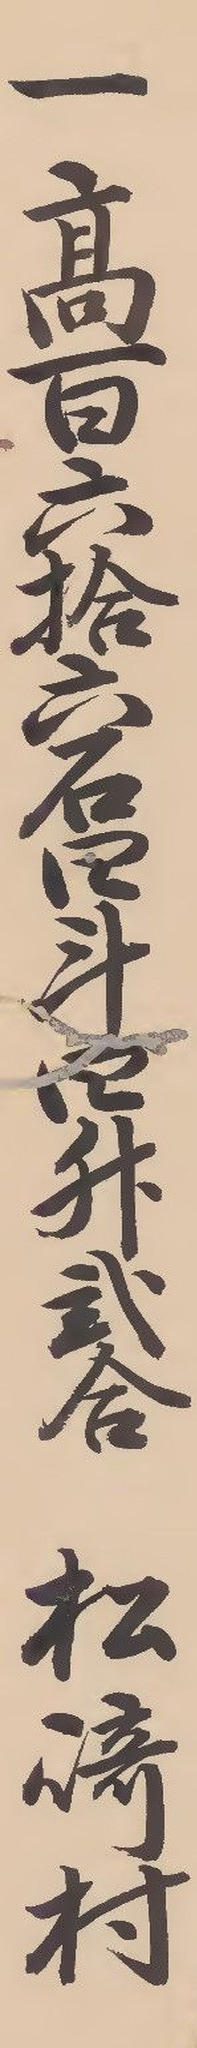一高百六拾六石四斗四升弐合松崎村

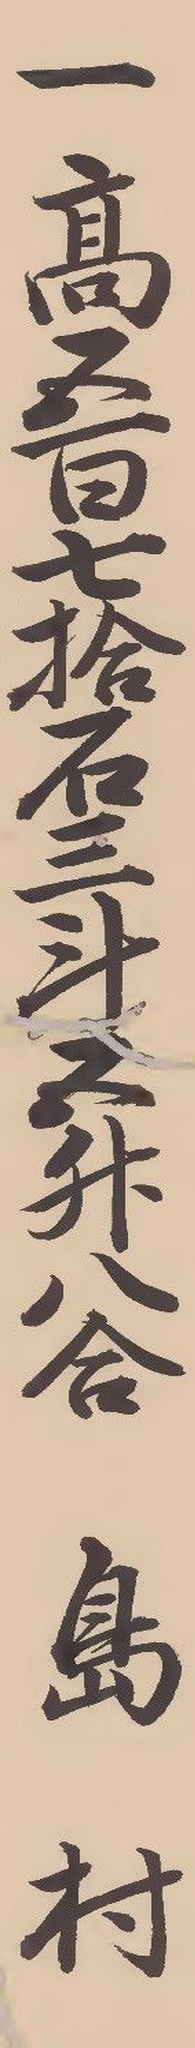一高五百七拾石三斗五升八合島村
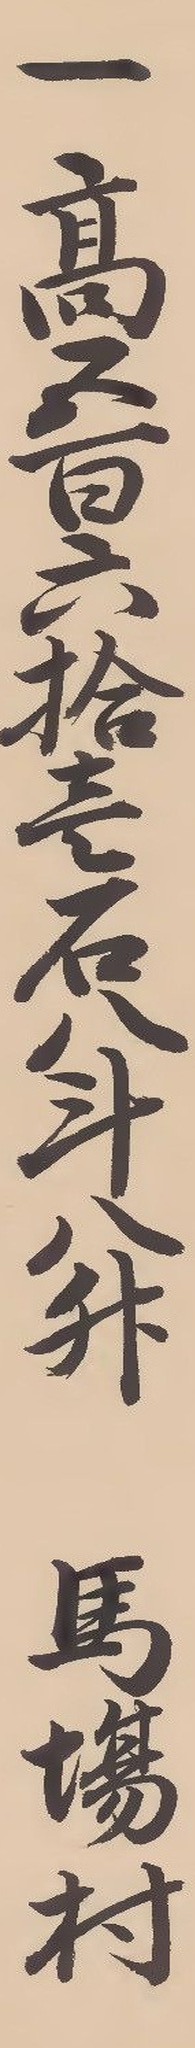一高五百六拾壱石八斗八升馬場村
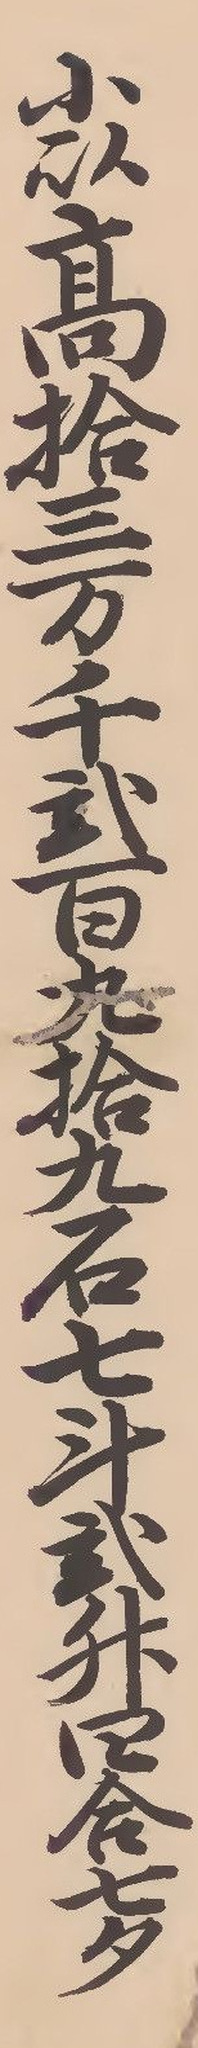小以高拾三万千弐百九拾九石七斗弐升四合七勺

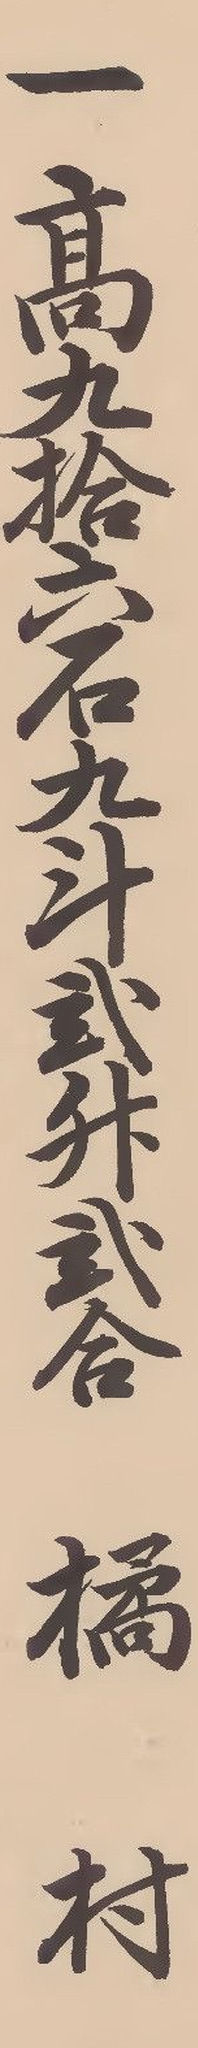一高九拾六石九斗弐升弐合橘村
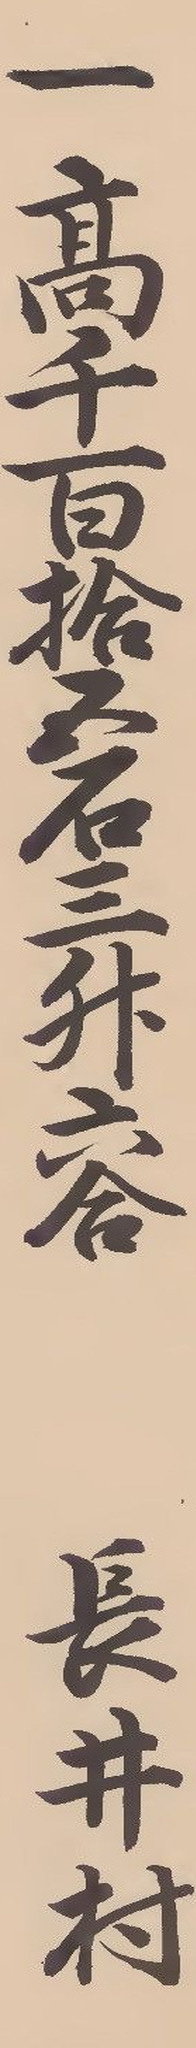一高千百拾五石三升六合長井村
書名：加賀国郷帳
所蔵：国立公文書館 National Archives of Japan
